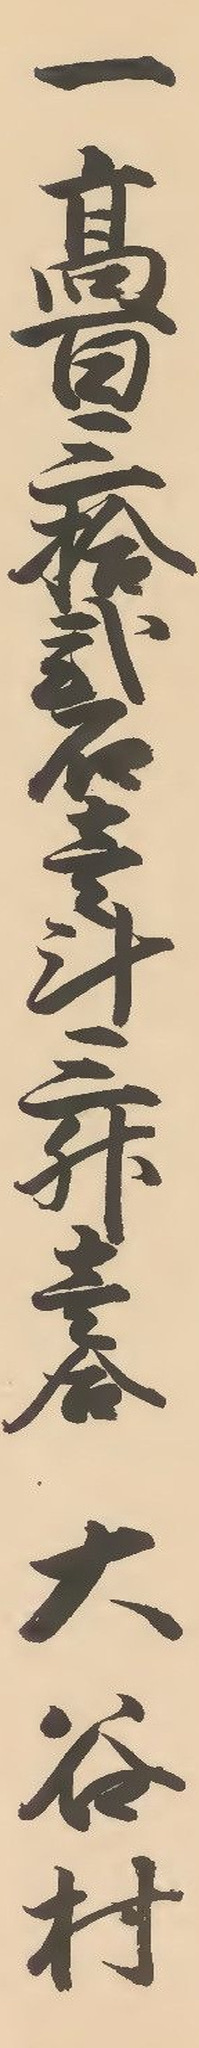一高百三拾弐石壱斗三升壱合大谷村
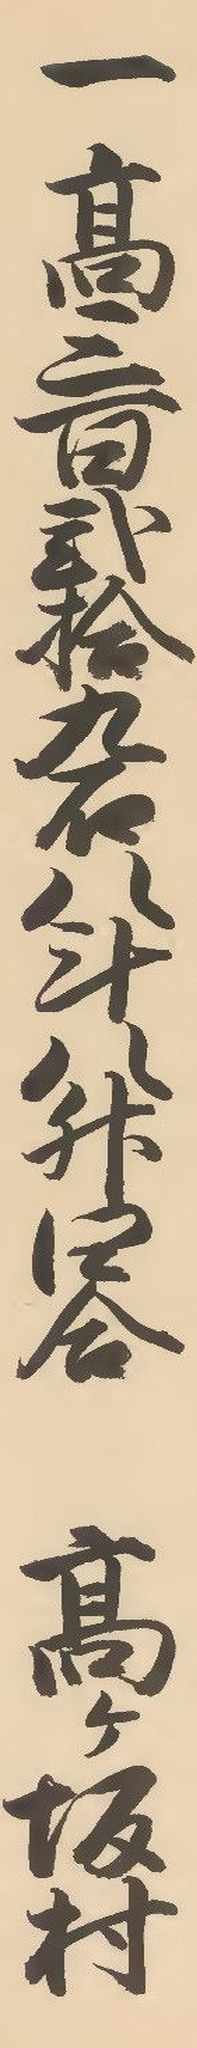一高三百弐拾九石八斗八升四合高ヶ坂村
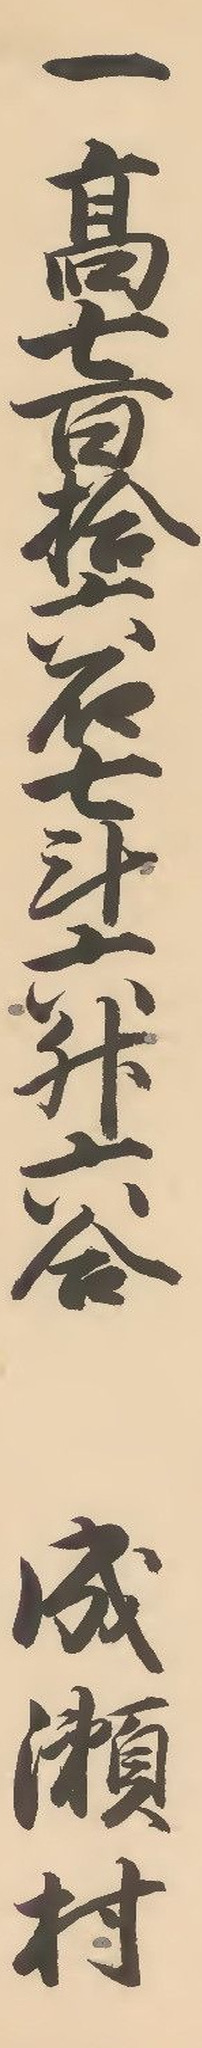一高七百拾六石七斗六升六合成瀬村

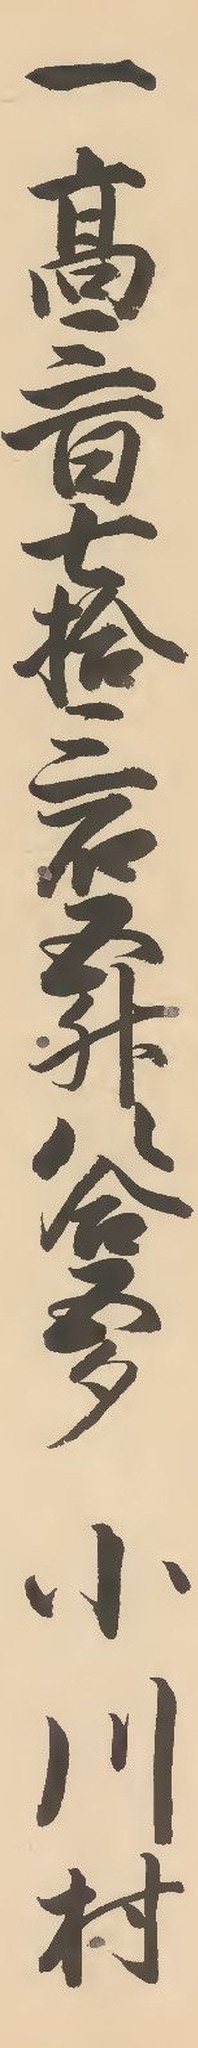一高三百七拾三石五升八合五勺小川村
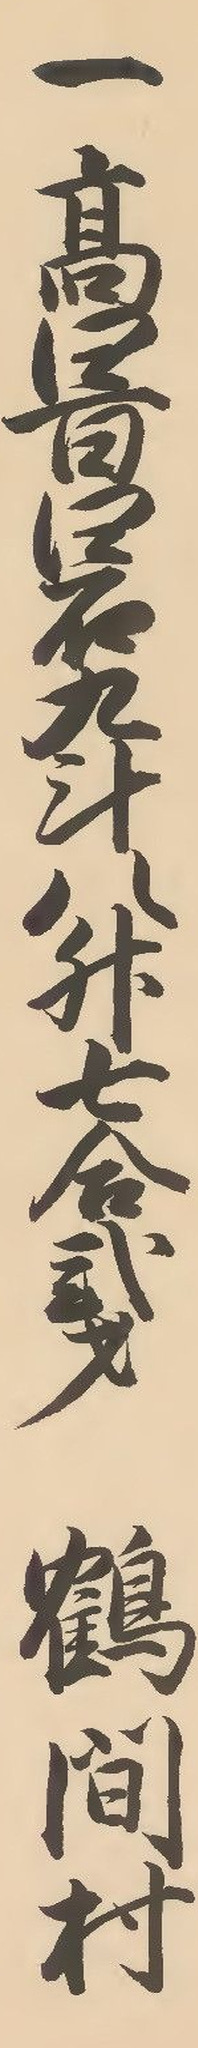一高四百四石九斗八升七合弐才鶴間村
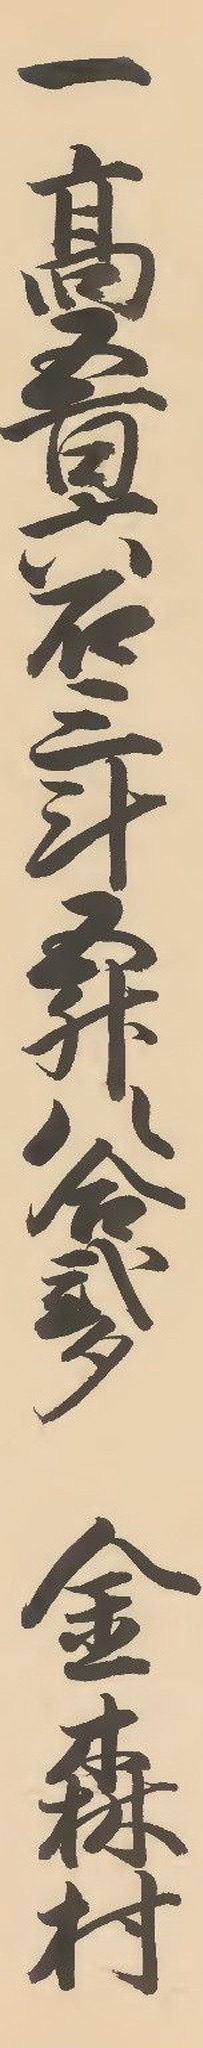一高五百六石三斗五升八合弐勺金森村
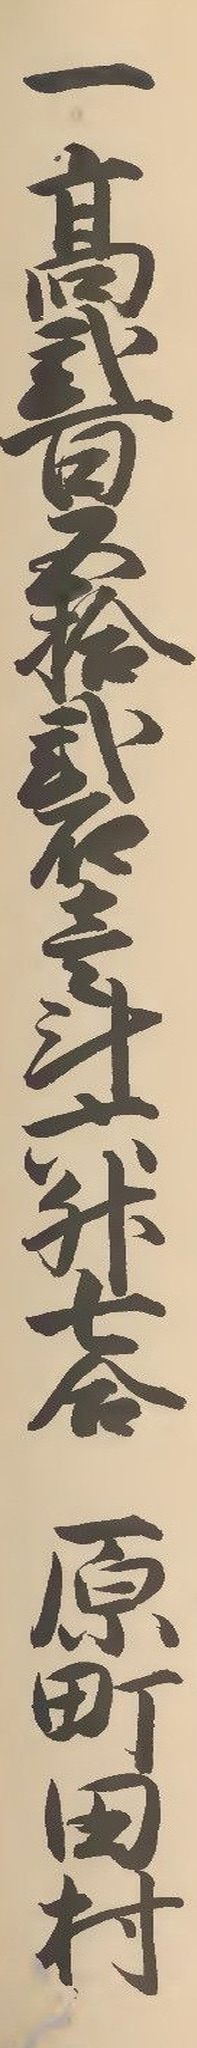一高弐百五拾弐石壱斗六升七合原町田村
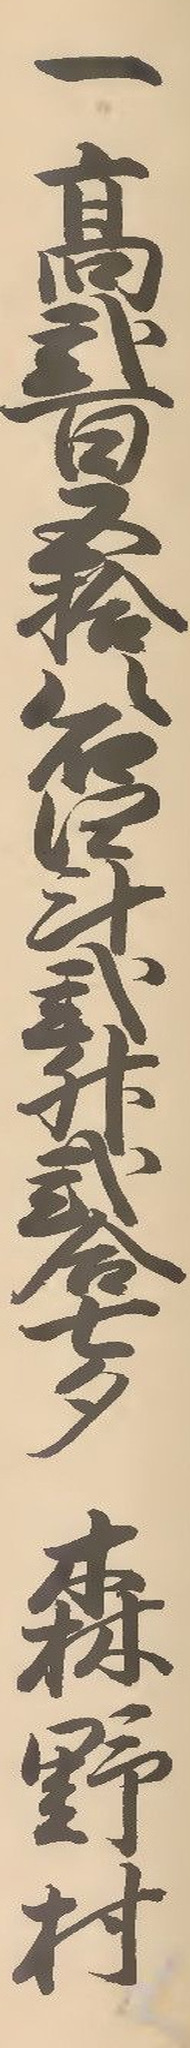一高弐百五拾八石四斗弐升弐合七勺森野村
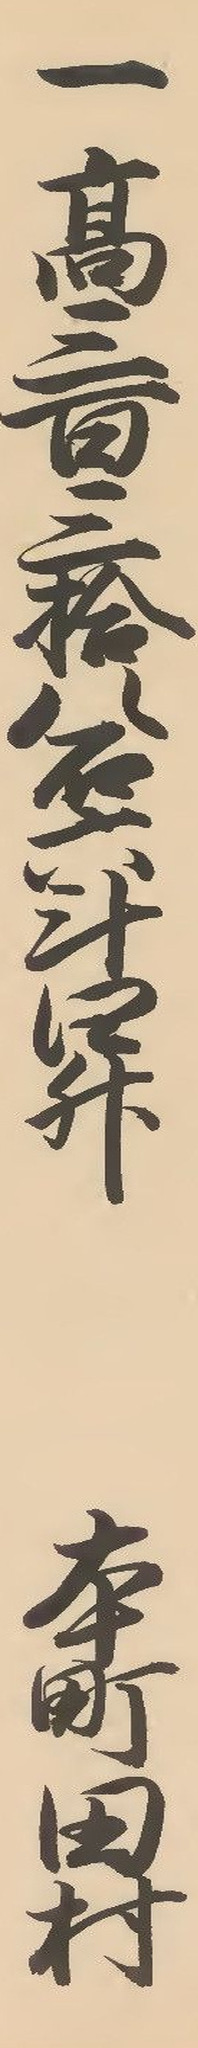一高三百三拾八石六斗四升本町田村
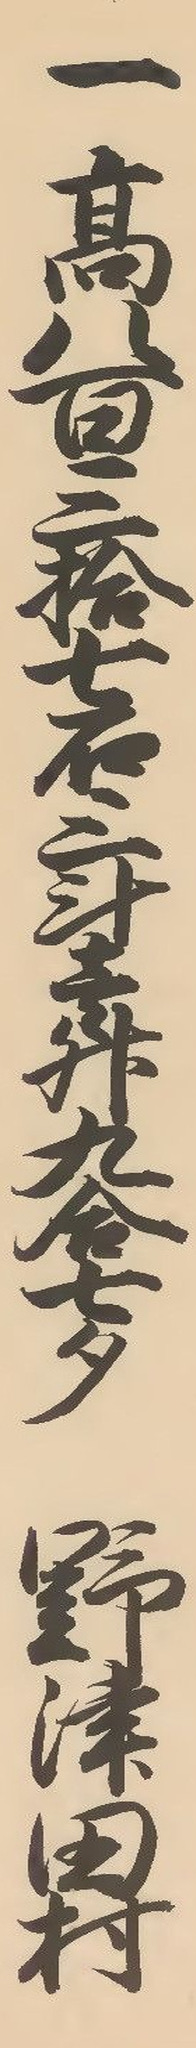一高八百三拾七石三斗壱升九合七勺野津田村
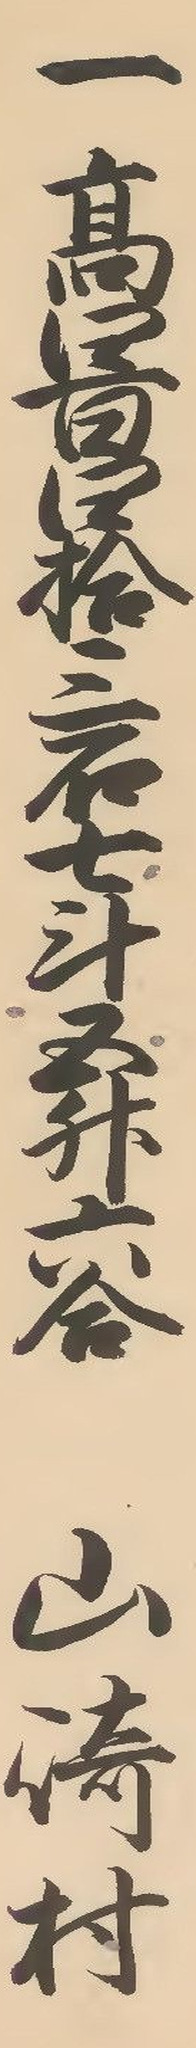一高四百四拾三石七斗五升六合山崎村

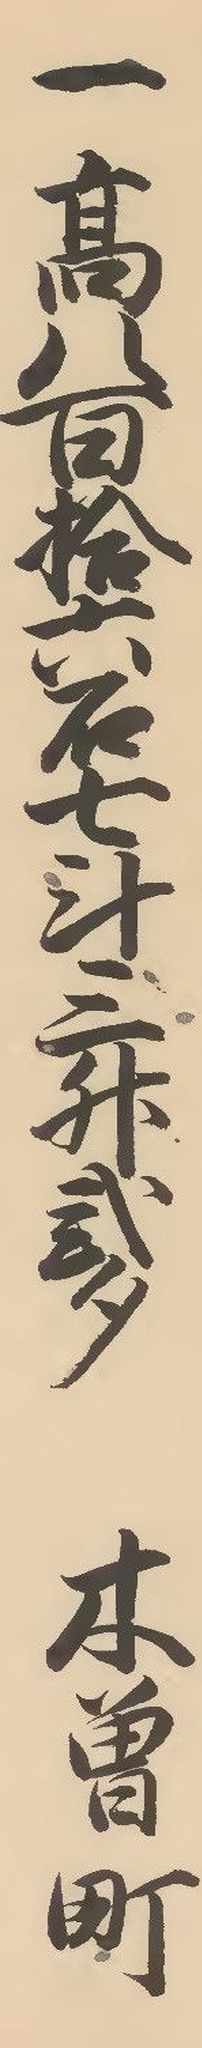一高八百拾六石七斗三升弐勺木曽町
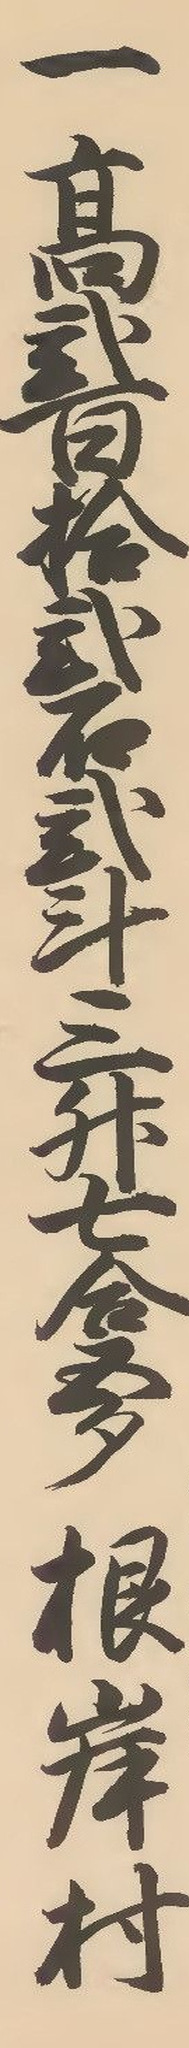一高弐百拾弐石弐斗三升七合五勺根岸村
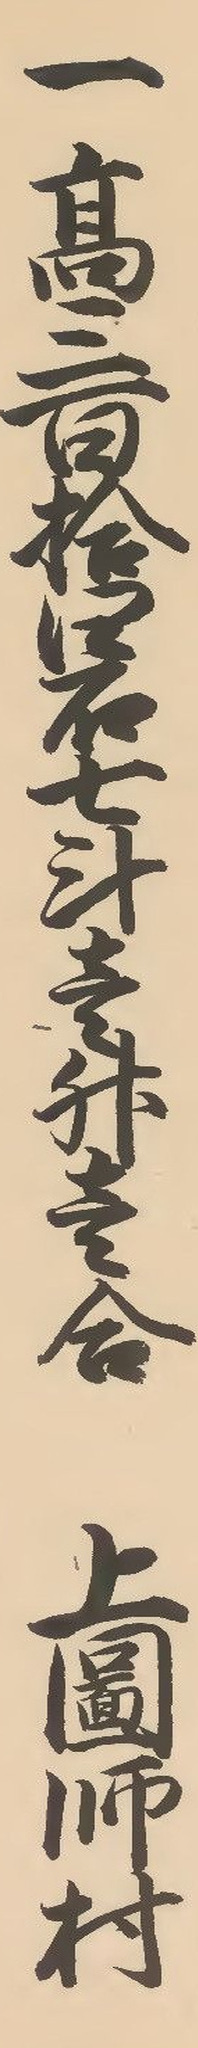一高三百拾四石七斗壱升壱合上図師村
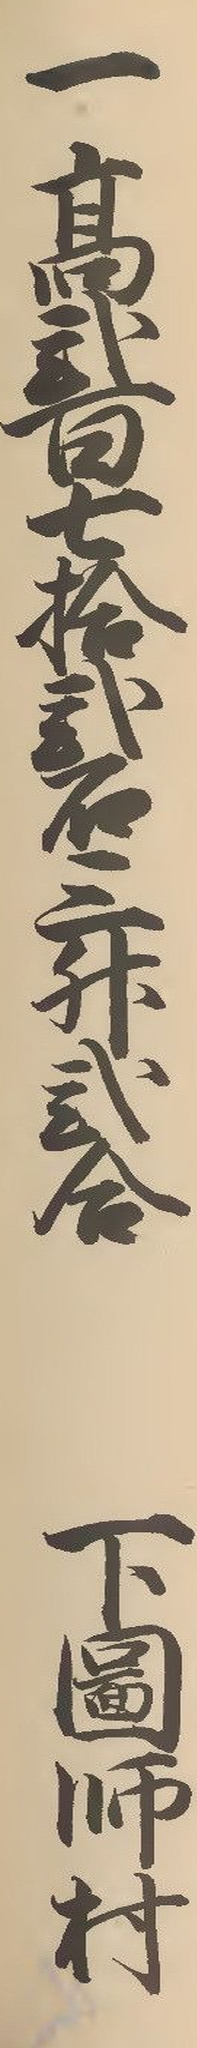一高弐百七拾弐石三升弐合下図師村
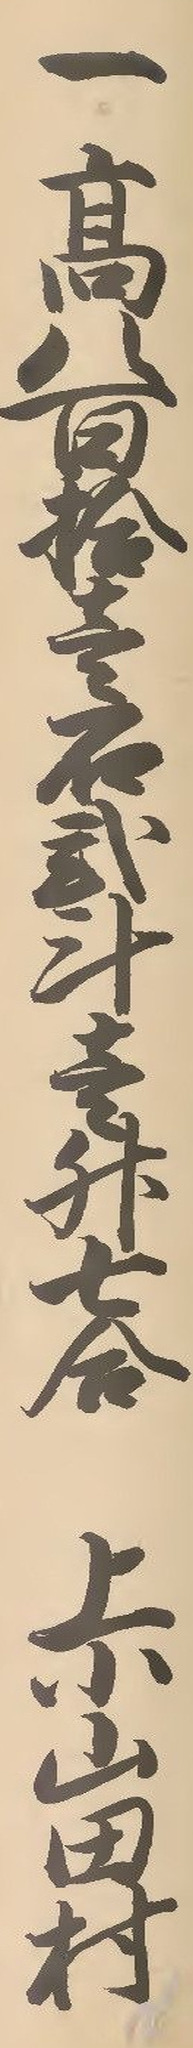一高八百拾壱石弐斗壱升七合上小山田村
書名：武蔵国郷帳　上
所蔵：国立公文書館 National Archives of Japan
